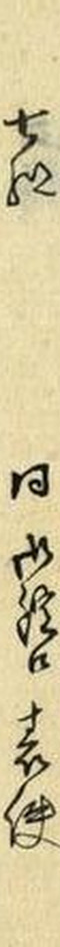同七組同御錠口表使
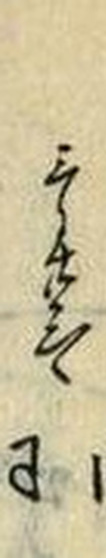三月廿三日
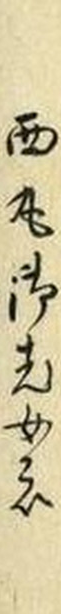同西丸御老女衆
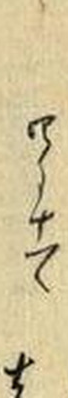四月十一日
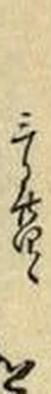三月廿四日
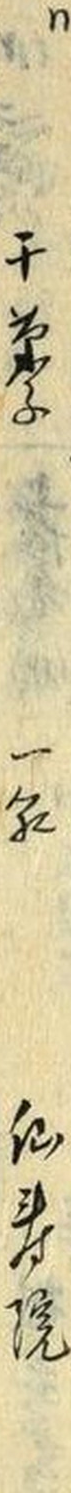干菓子一箱仙寿院
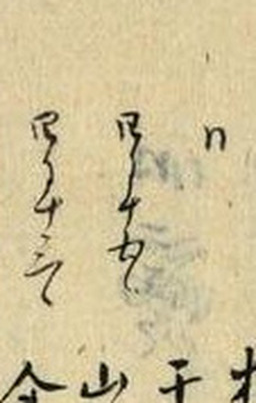四月十五日
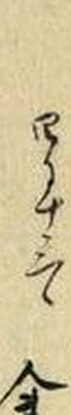四月十三日
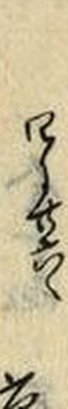四月廿六日
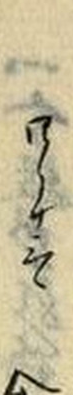四月十三日
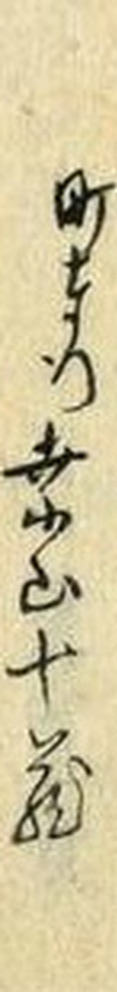同断町奉行桑山十蔵
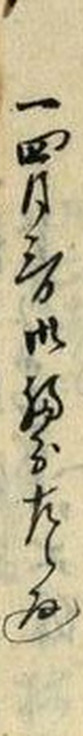一四月三日御移分左之通
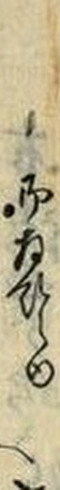御拝領之内
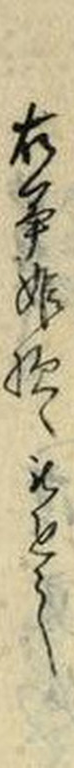右箏姫様へ被進之

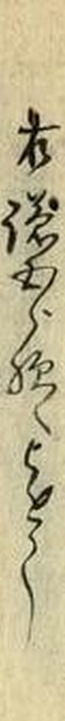右謙五郎様へ被進之
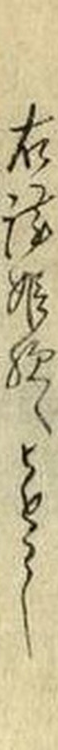右謹姫様へ被進之
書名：少傅日録抄（斉承付側向頭取日記、在府）
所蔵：福井県文書館 Fukui Prefectural Archives
